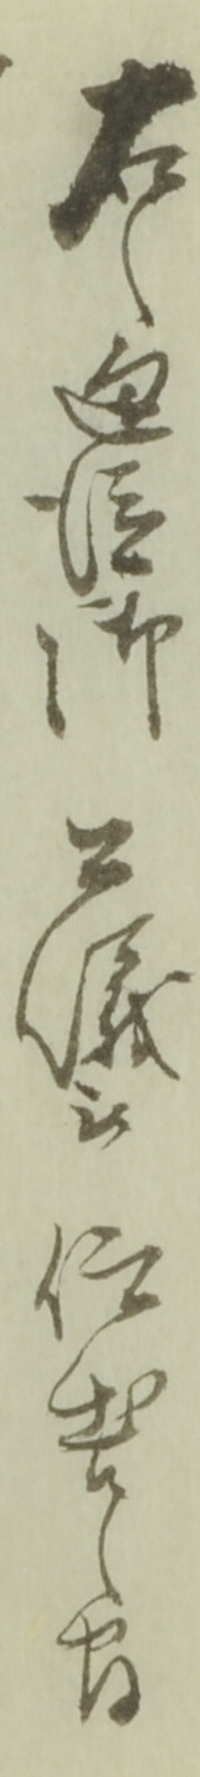右之通従御公儀被仰出候之間
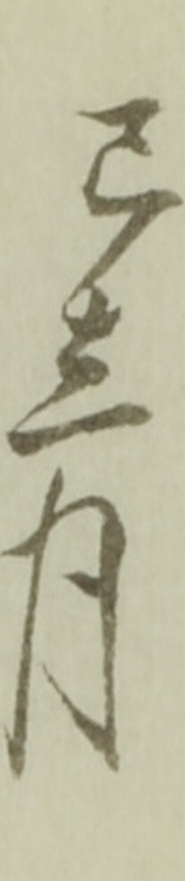巳十二月
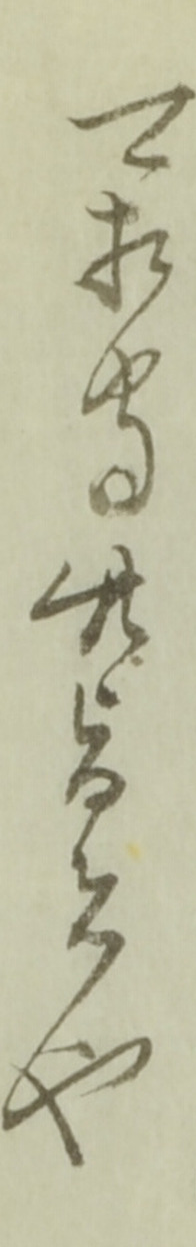可相守此旨者也
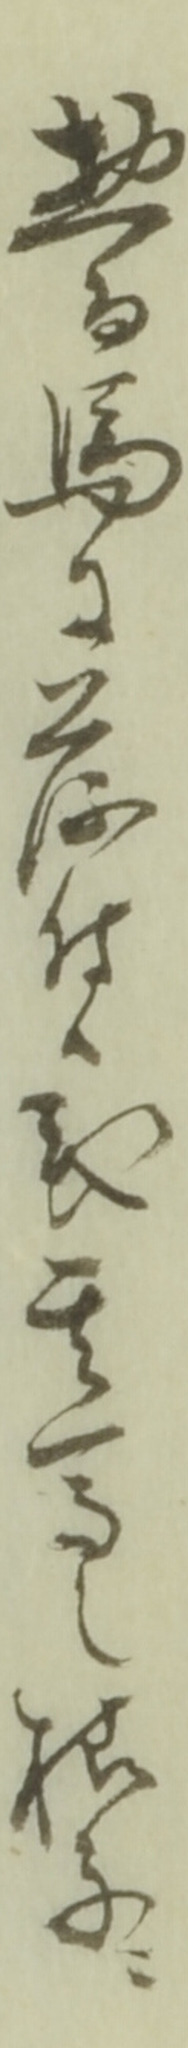惣而馬に荷付候義其馬之様子ニ
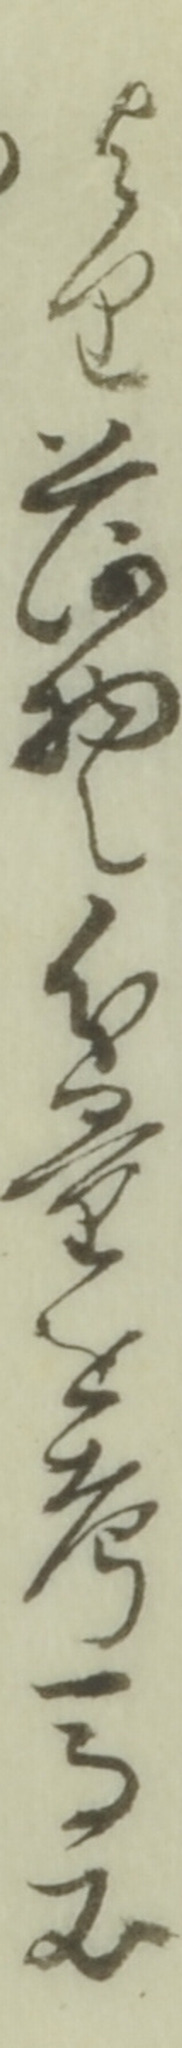より荷物之分量を考馬不
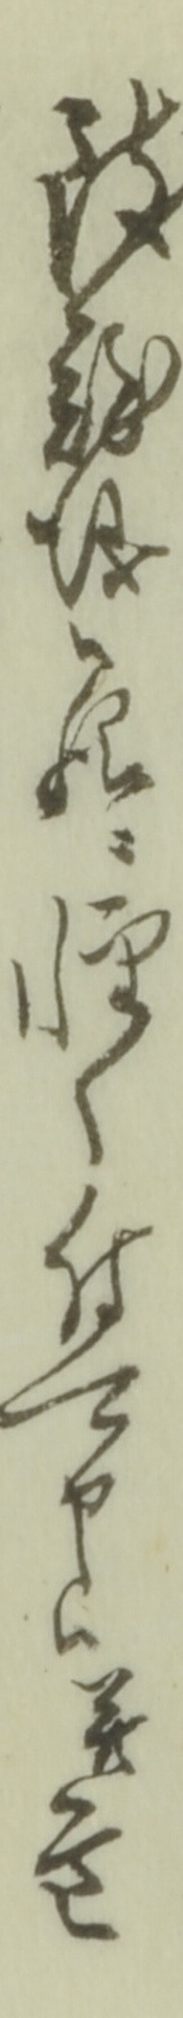致難儀候様ニ軽く付申候并道
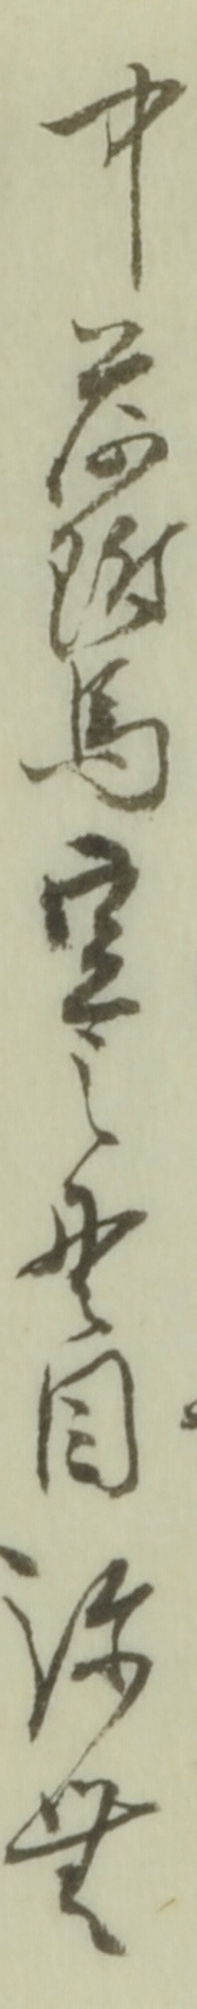中荷附馬定之貫目弥無
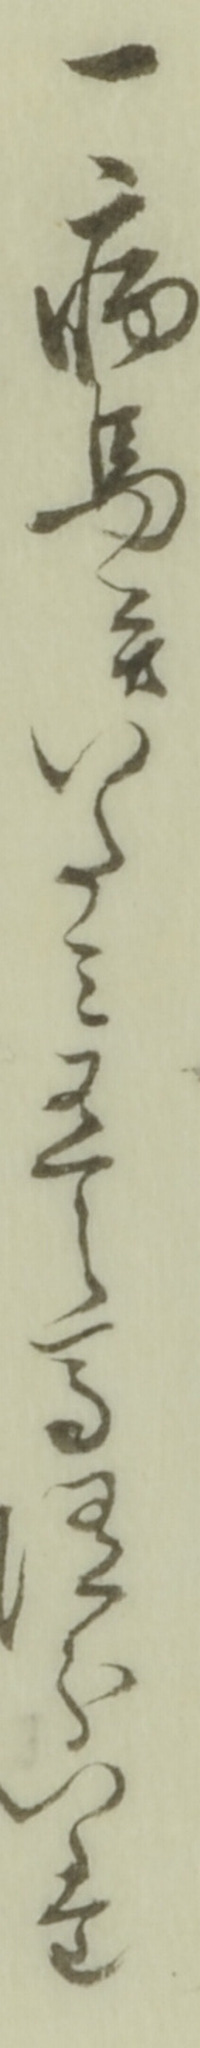一病馬并いたみ有之馬随分いた
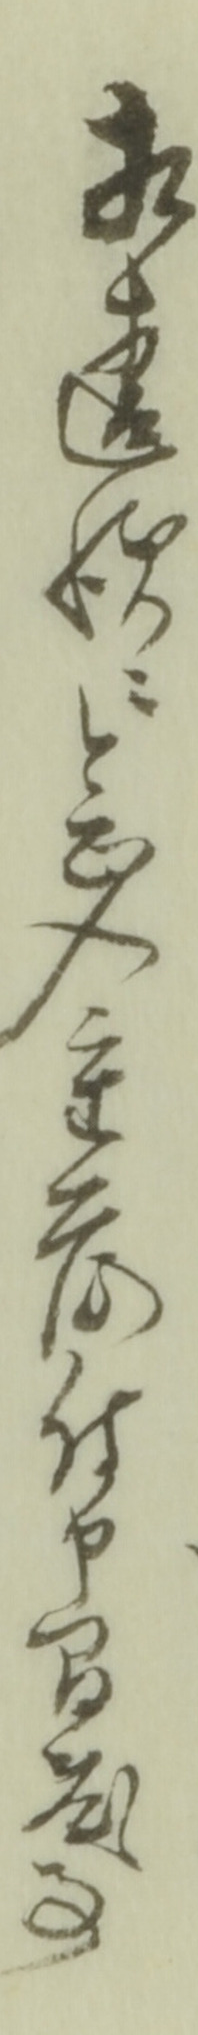相違様ニ念入置重荷付申間敷候事
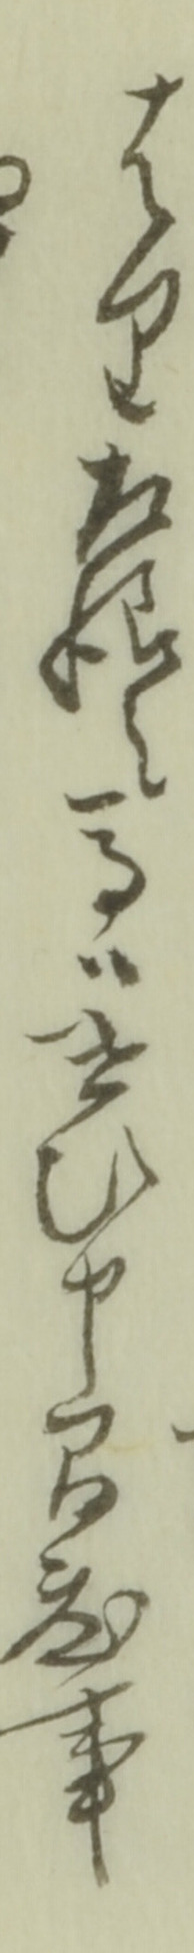はり左様之馬は遣ひ申間敷事
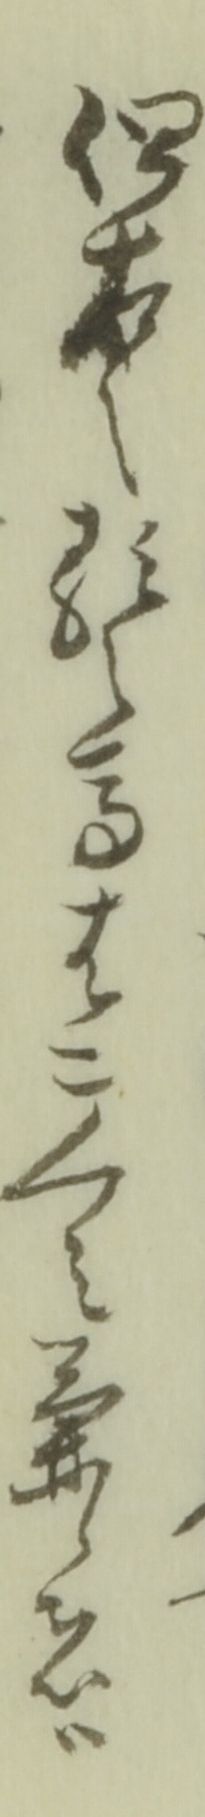但右之類之馬はこくみ兼候者ハ
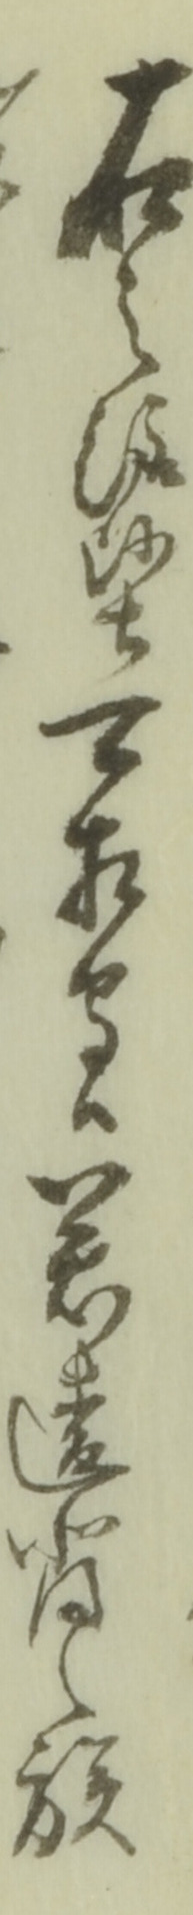右之趣堅可相守候若違背之族
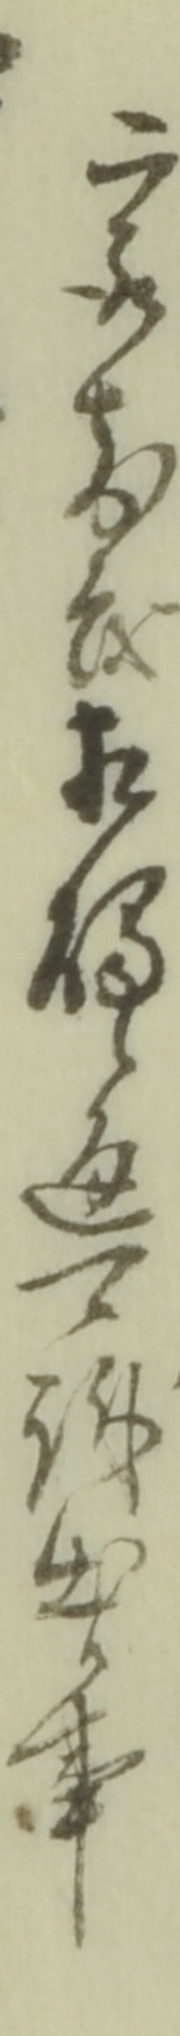最前茂相触候通可訴出候事
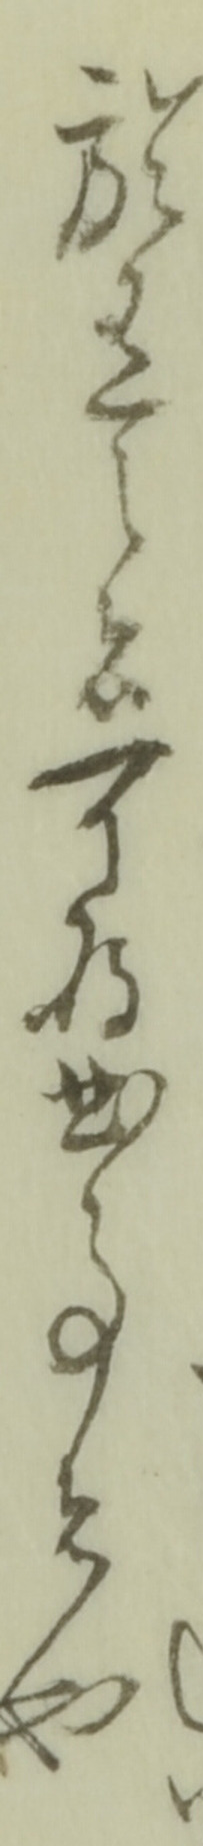於有之者可為曲事者也

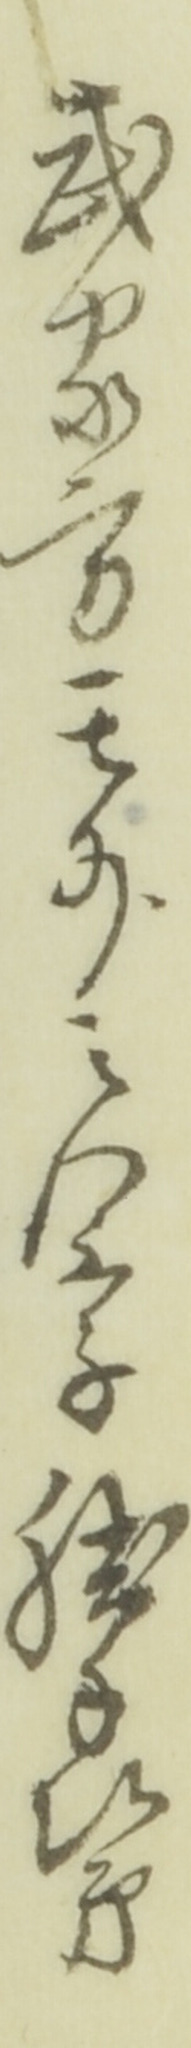武家方其外之金子勝手次第
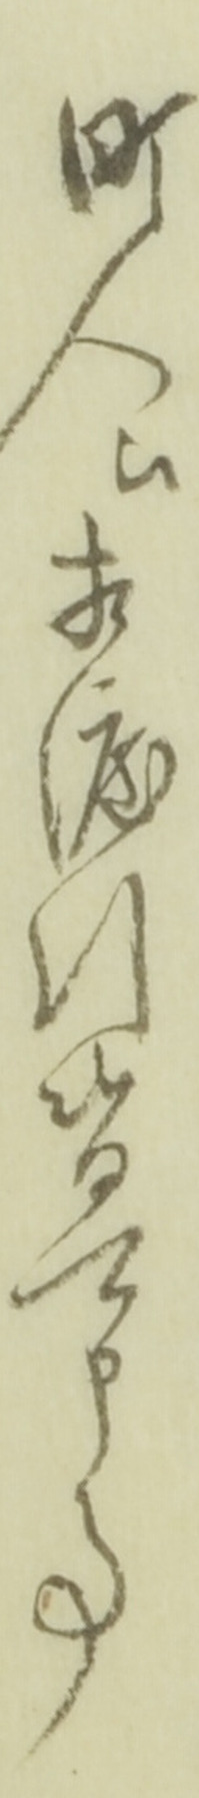町人江相渡引替可申事
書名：御公儀様御領主様御触書控
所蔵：伊那市立高遠町図書館・合同会社AMANE
